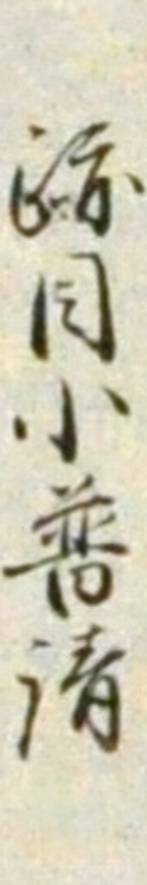跡目小普請
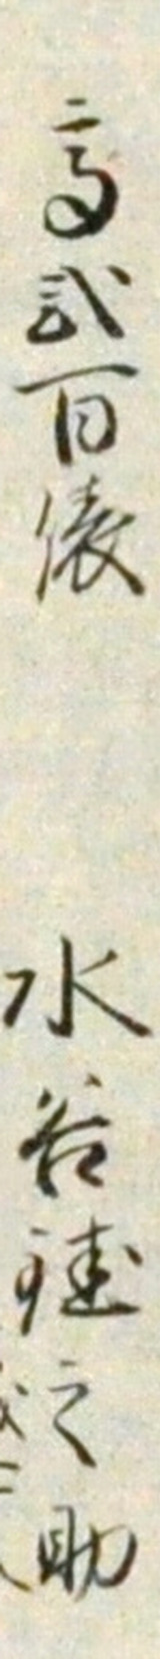高弐百俵水谷銈之助
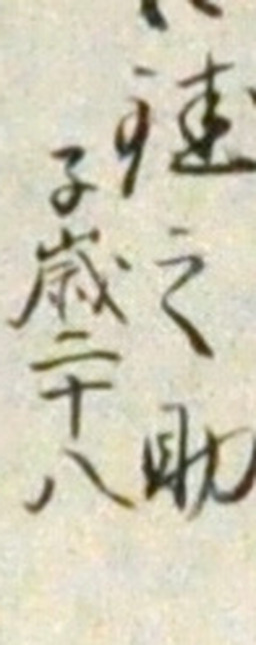子歳二十八
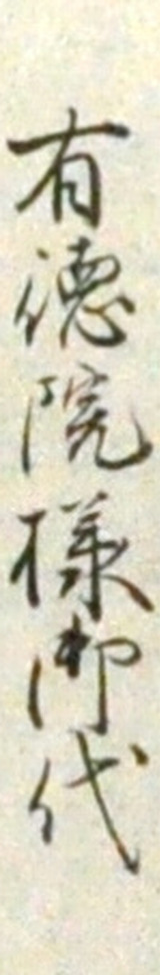有徳院様御代
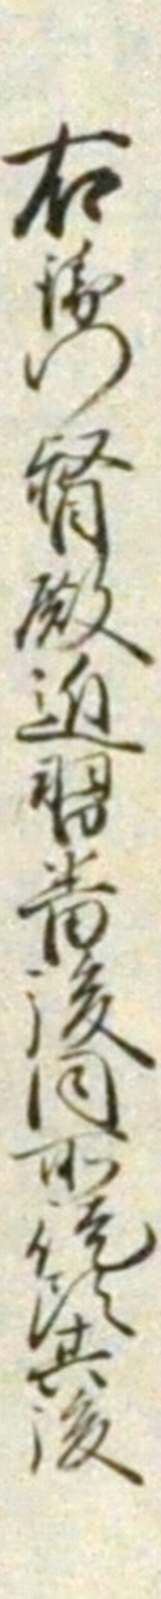右衛門督殿近習番後同所徒頭其後
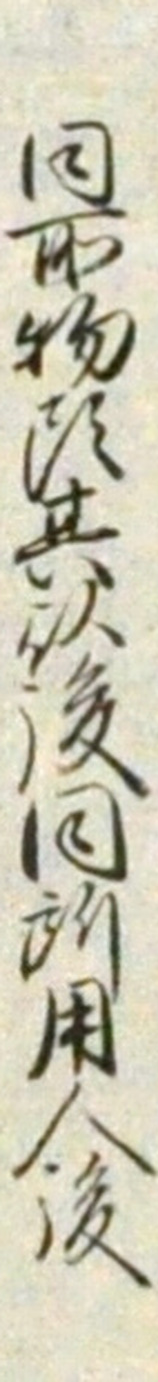同所物頭其以後同所用人後
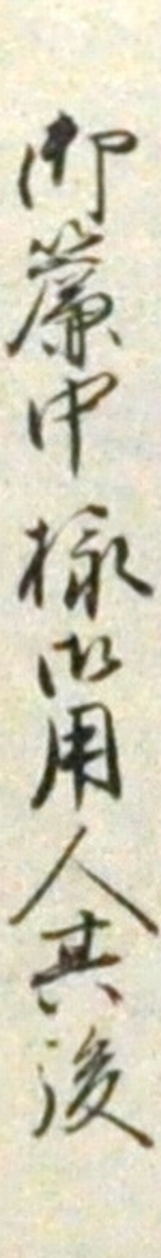御簾中様御用人其後
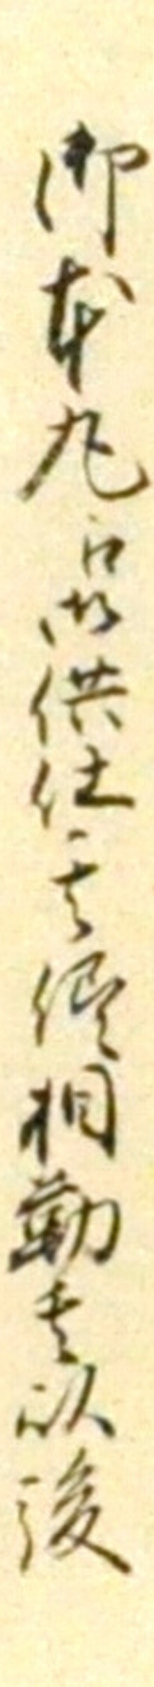御本丸江御供仕其侭相勤其以後
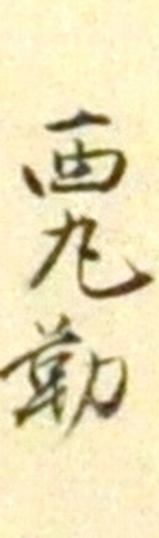西丸勤
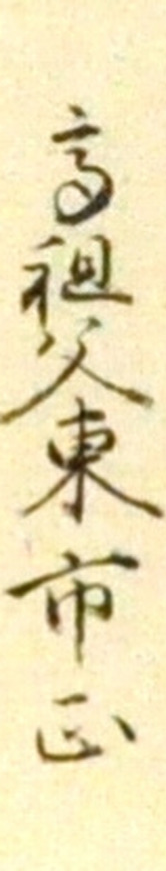高祖父東市正
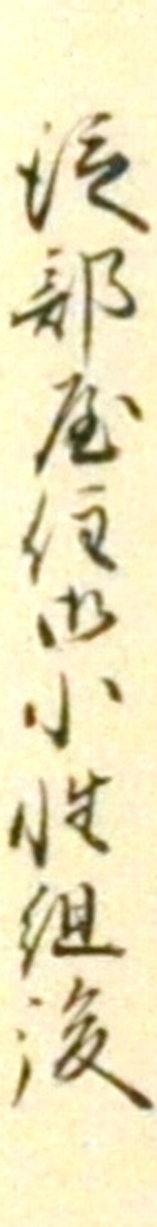従部屋住御小姓組後

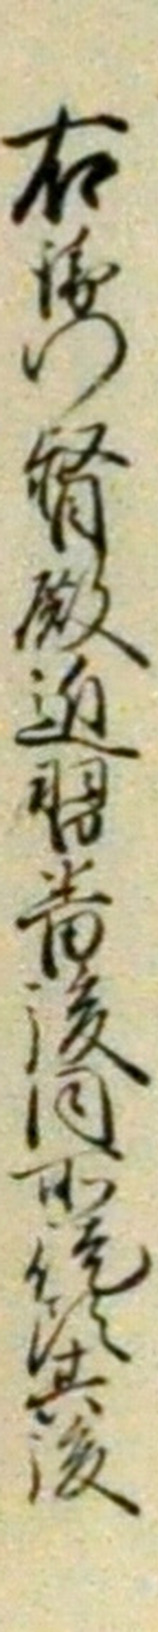右衛門督殿近習番後同所徒頭其後
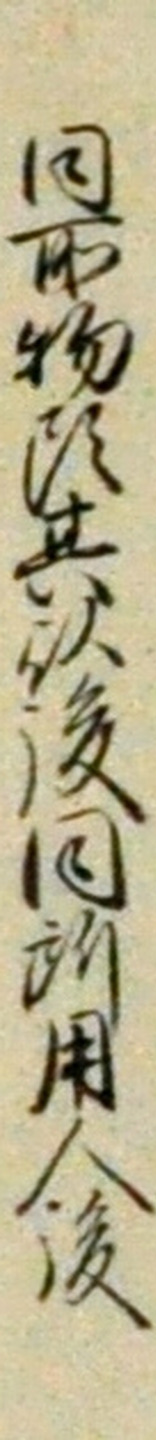同所物頭其以後同所用人後
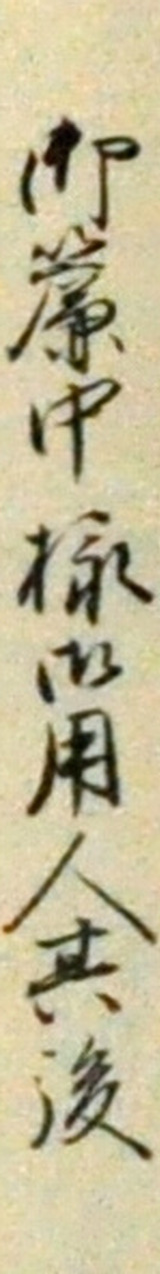御簾中様御用人其後
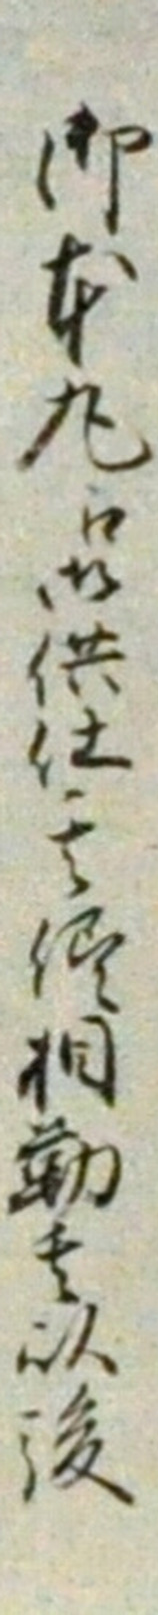御本丸江御供仕其侭相勤其以後
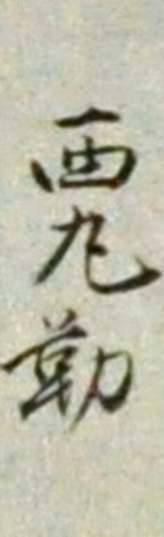西丸勤
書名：若年寄御役中御調書付
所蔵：伊那市立高遠町図書館・合同会社AMANE
